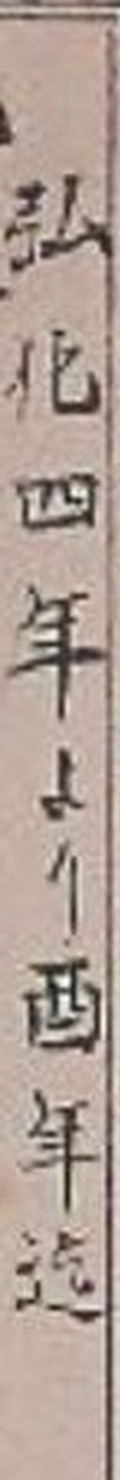弘化四年より酉年迄
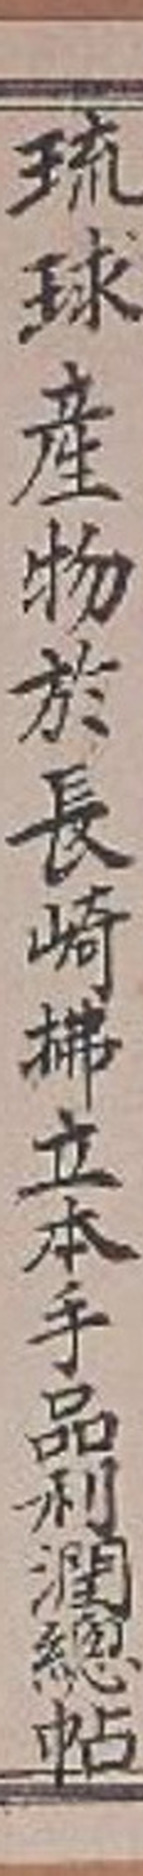琉球産物於長崎拂立本手品利潤總帖

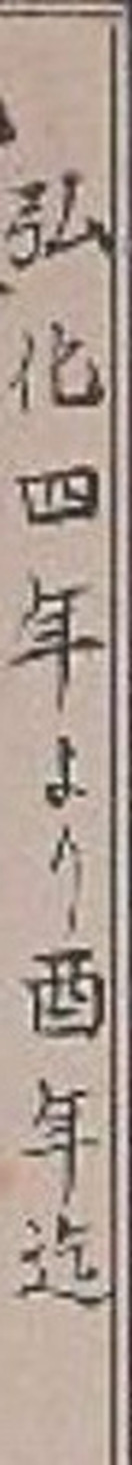弘化四年より酉年迄
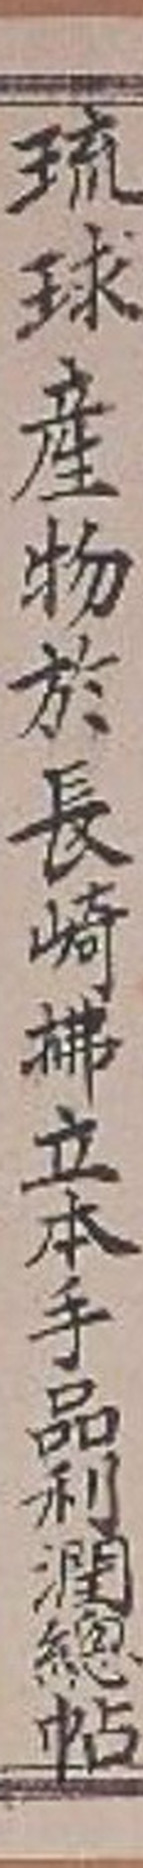琉球産物於長崎拂立本手品利潤總帖

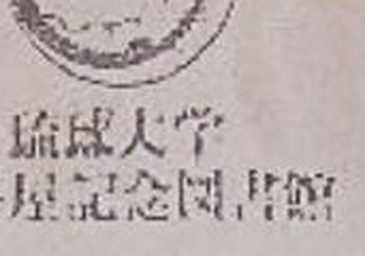琉球大学
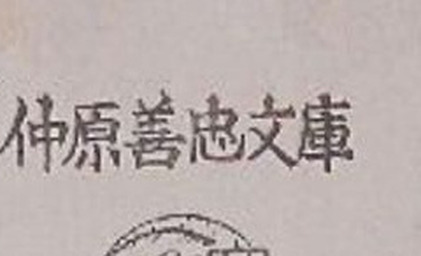仲原善忠文庫
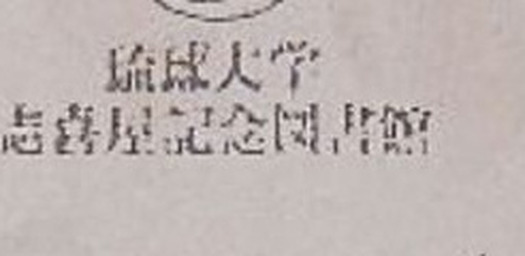志喜屋記念図書館
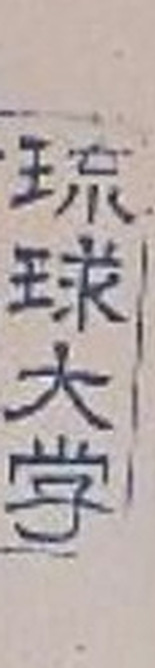琉球大学

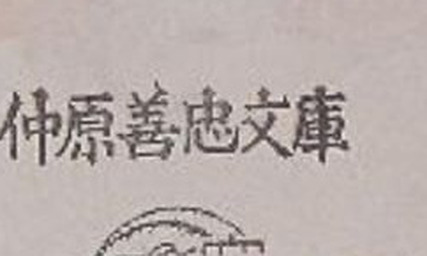仲原善忠文庫
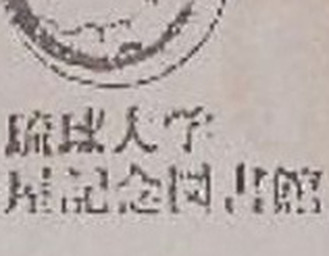琉球大学

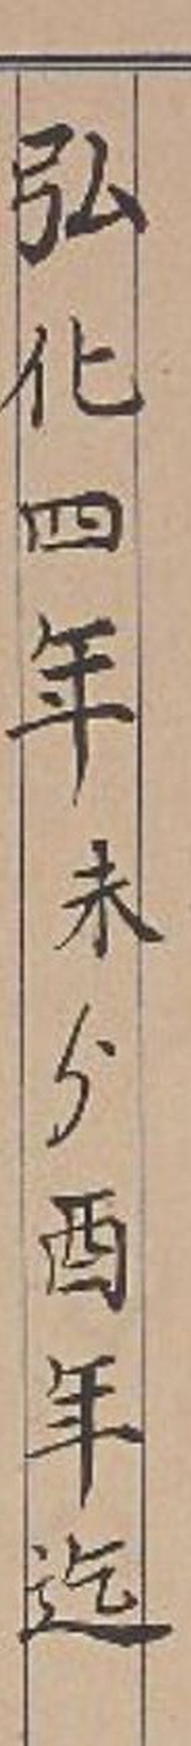弘化四年未ゟ酉年迄
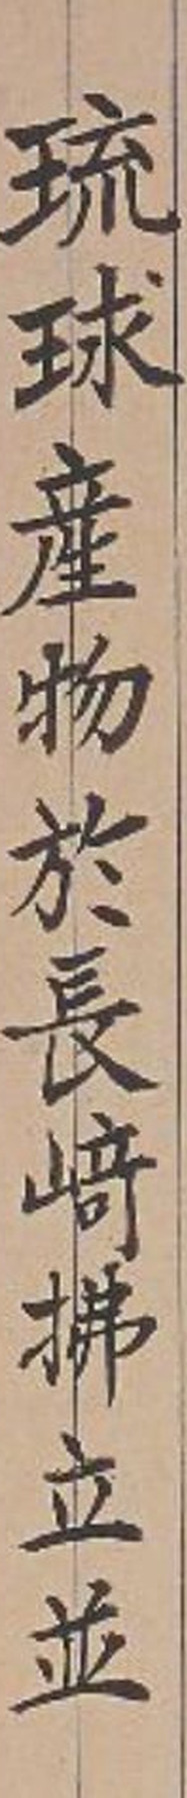琉球産物於長﨑拂立並
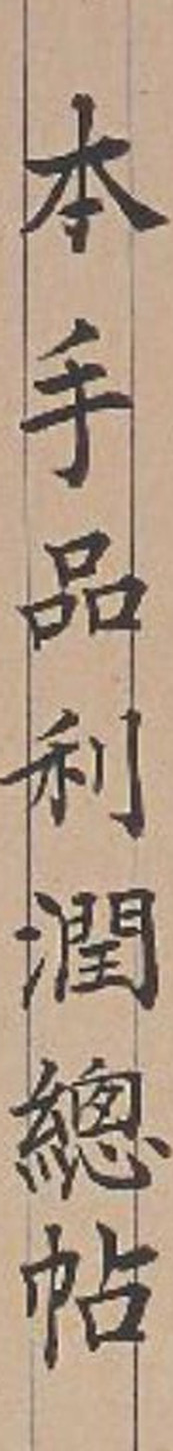本手品利潤總帖

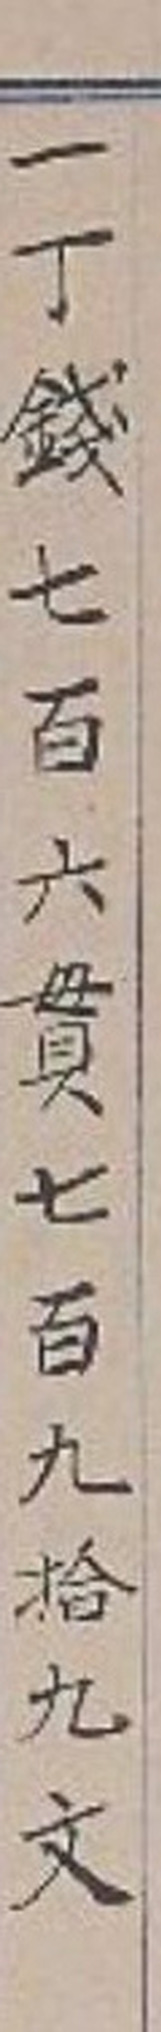一丁錢七百六貫七百九拾九文
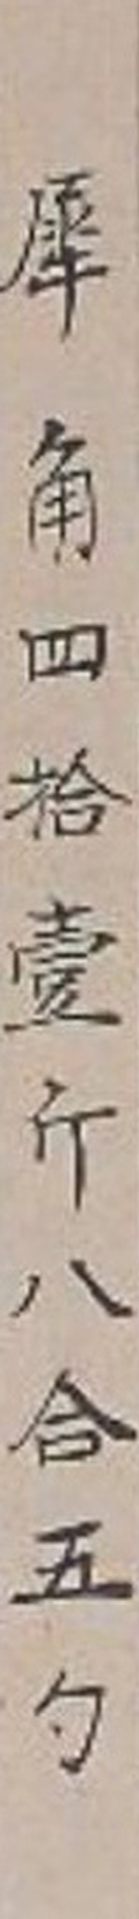犀角四拾壹斤八合五勺
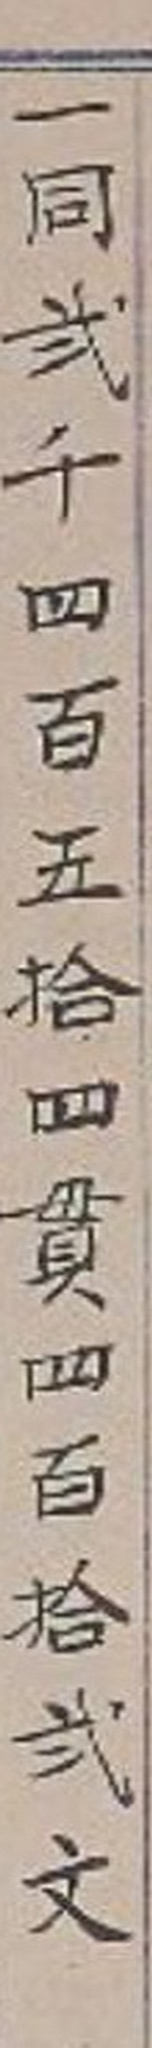一同弐千四百五拾四貫四百拾弐文
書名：琉球産物於長崎拂立並本手品利潤総帖 弘化四年より酉年迄
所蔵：University of the Ryukyus Library
